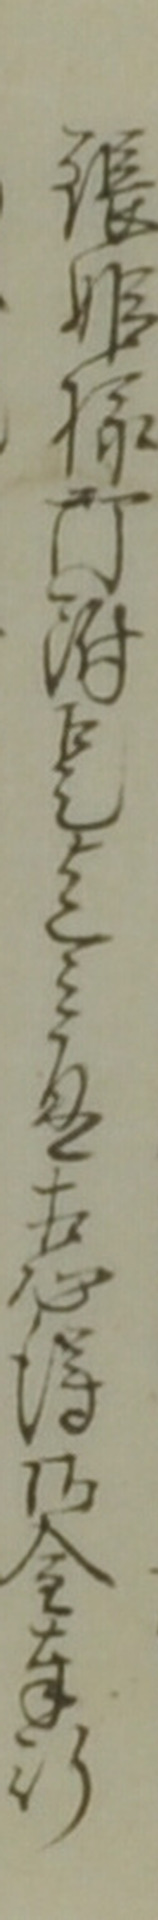鋹姫様御附是迄之通相心得御金奉行
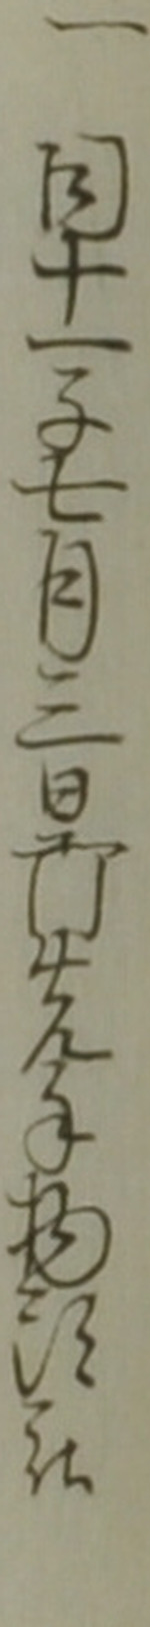一同十一子七月三日御先手物頭被
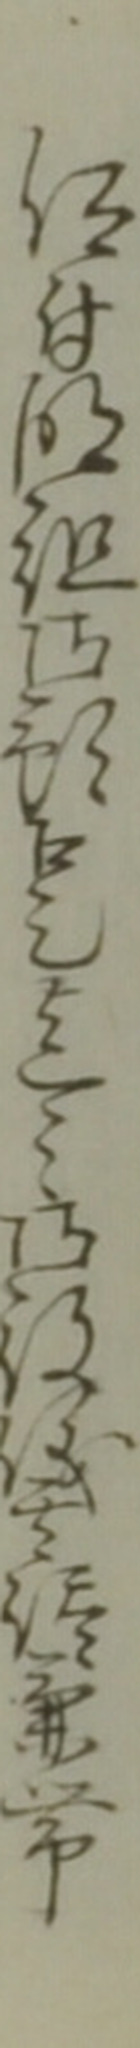仰付明組御預是迄之御役儀其侭兼帯
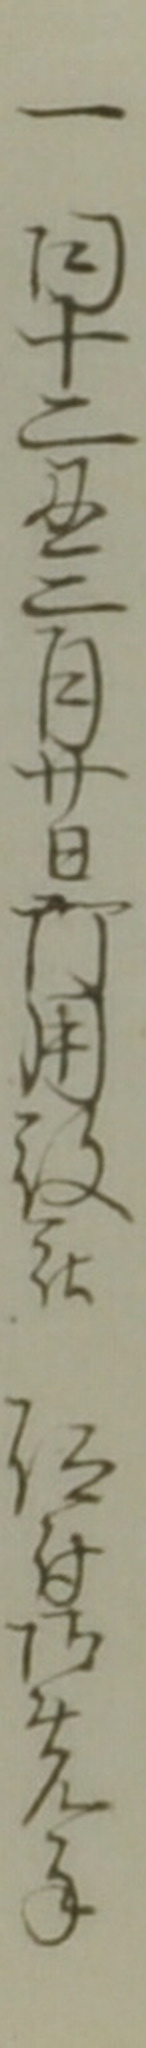一同十二丑三月廿日御用役被仰付御先手
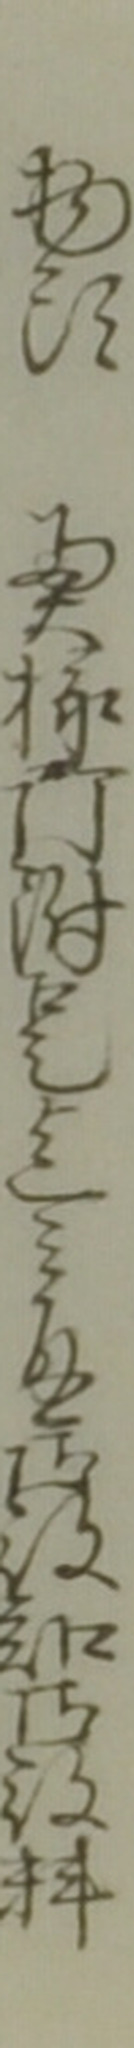物頭奥様御附是迄之通御役知御役料
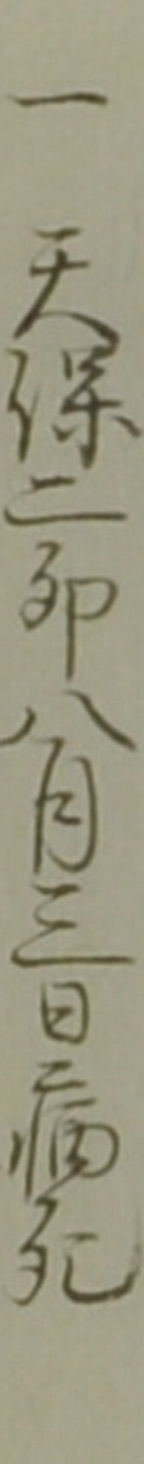一天保二卯八月三日病死
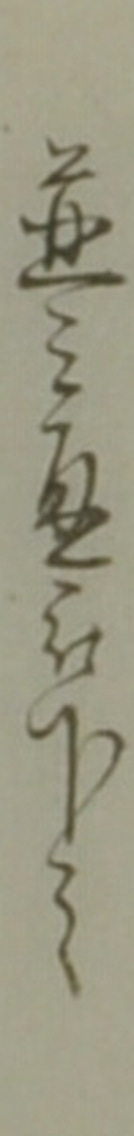並之通被下之
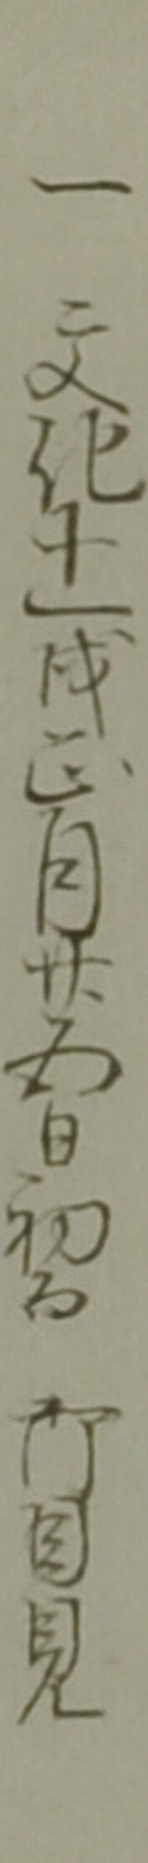一文化十一戌正月廿五日初而御目見
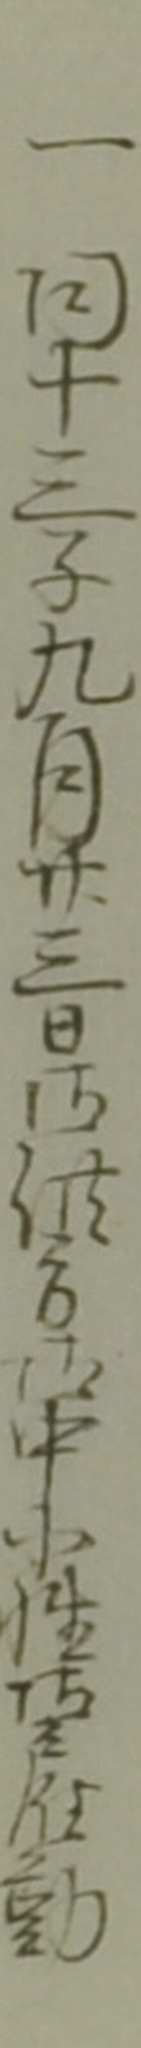一同十三子九月廿三日御供方御中小性御雇勤
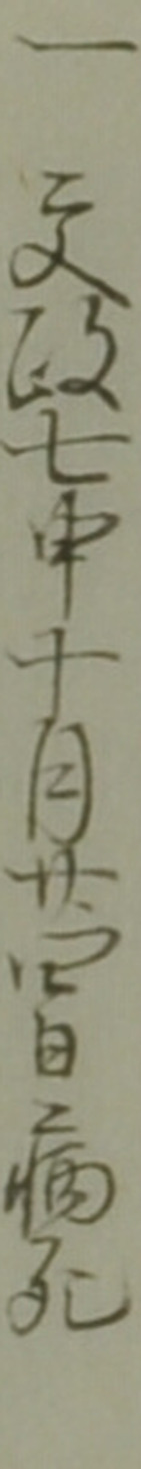一文政七申十月廿四日病死

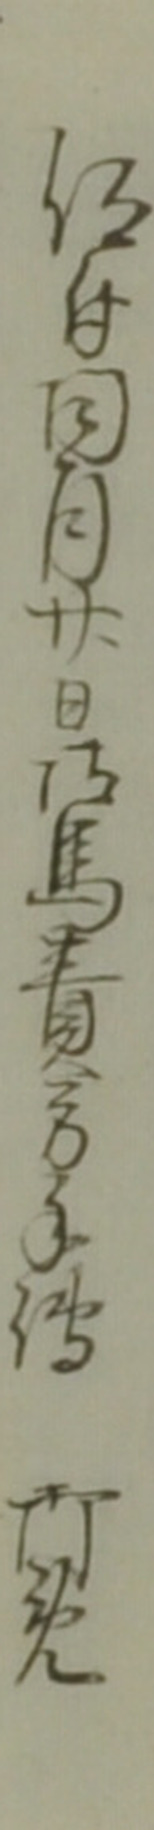仰付同月廿日御馬責方手傳御免
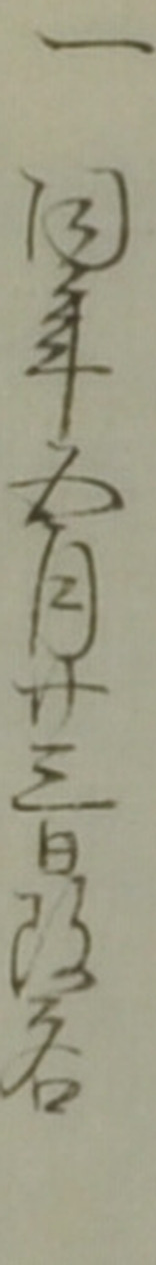一同年五月廿三日改名
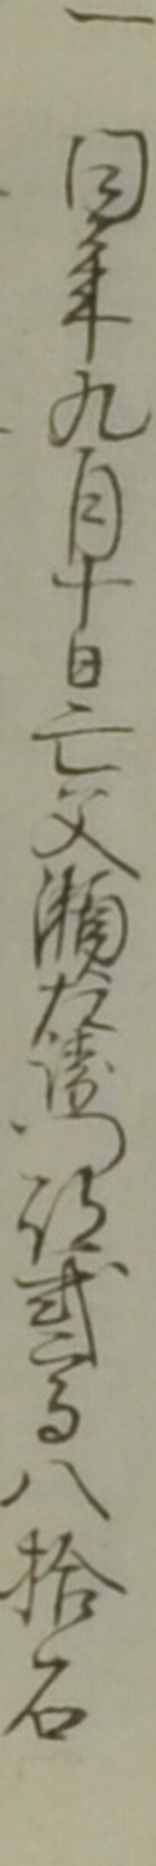一同年九月十日亡父瀬左衛門跡式高八拾石
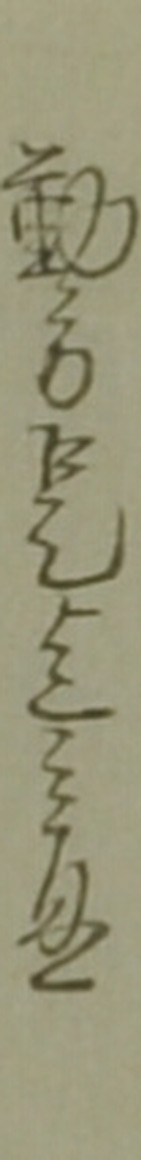勤方是迄之通
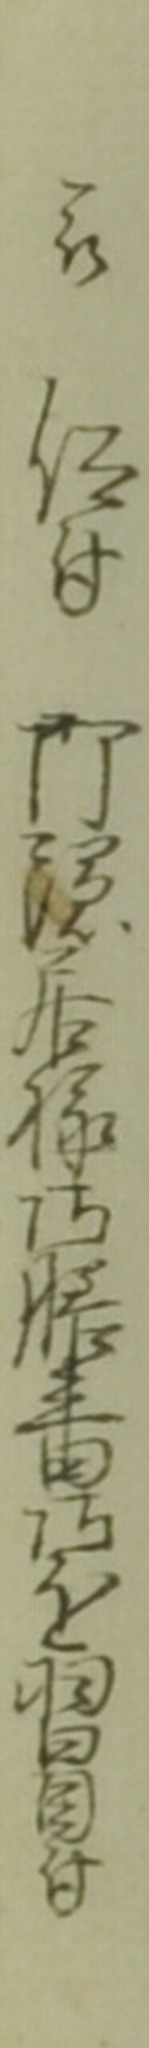被仰付御隠居様御膳番御近習目付
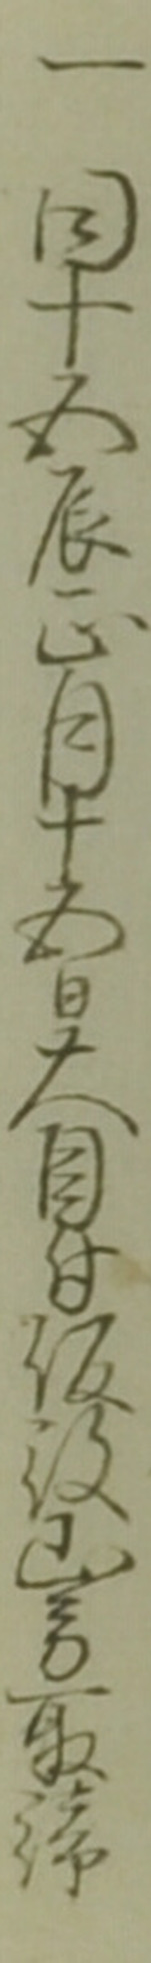一同十五辰正月十五日大目付仮役山方取締
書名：給人諸士勤仕録（三）
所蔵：伊那市立高遠町図書館・合同会社AMANE
